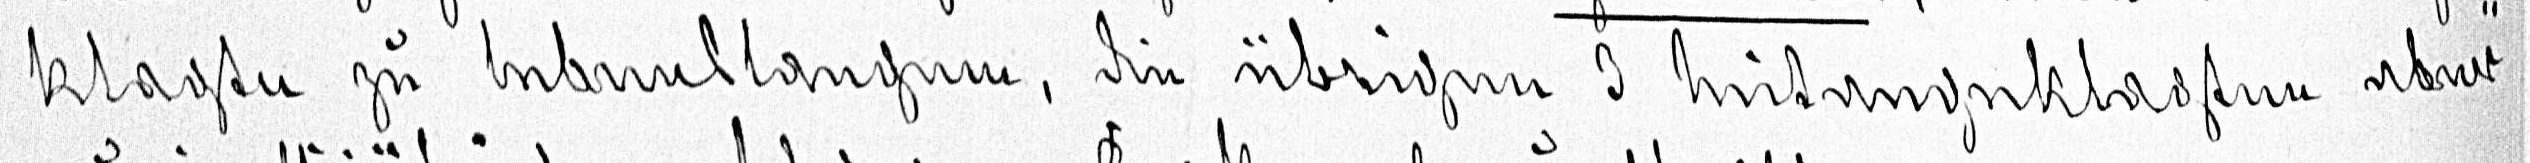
klagte zu lebenslangem, die übrigen 3 Mitangeklagten aber
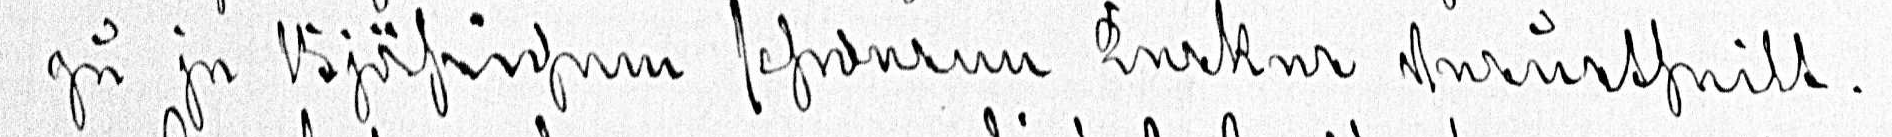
zu je 15jährigem schweren Kerker verurtheilt.
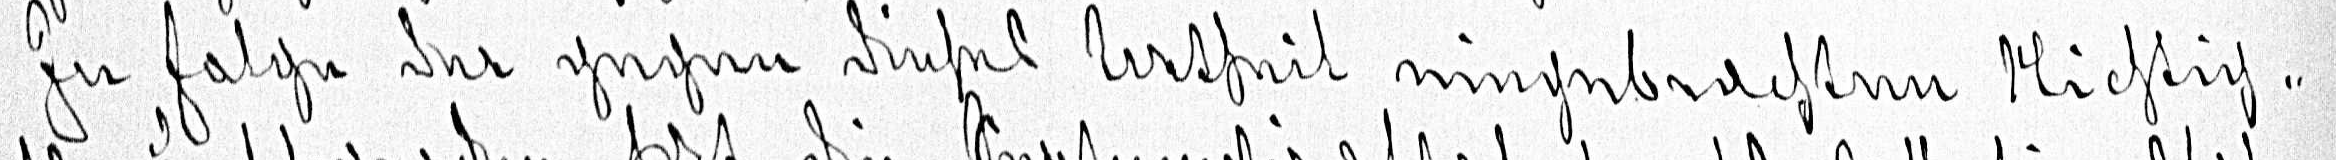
In Folge der gegen dieses Urtheil eingebrachten Nichtig¬
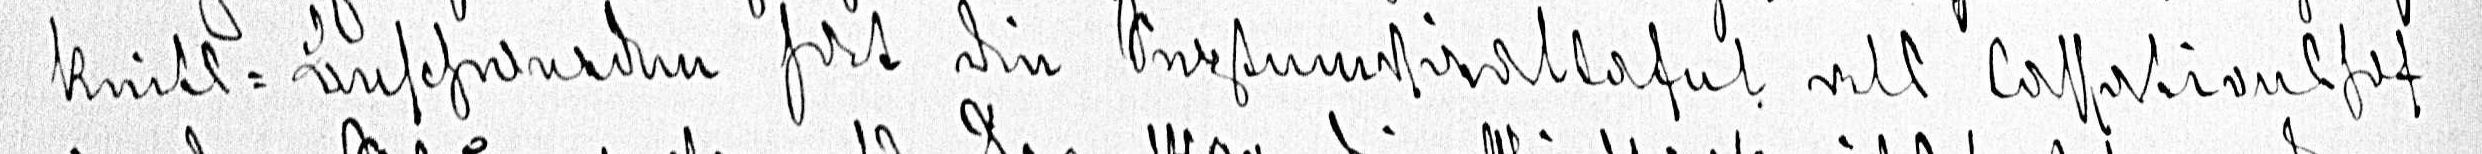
keits-Beschwerden hat die Septemviraltafel als Cassationshof
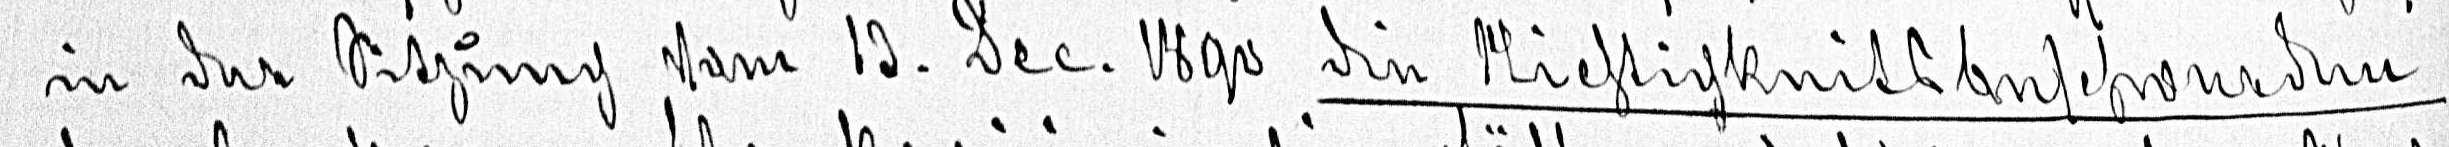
in der Sitzung vom 13. Dec 1890 die Nichtigkeitsbeschwerden
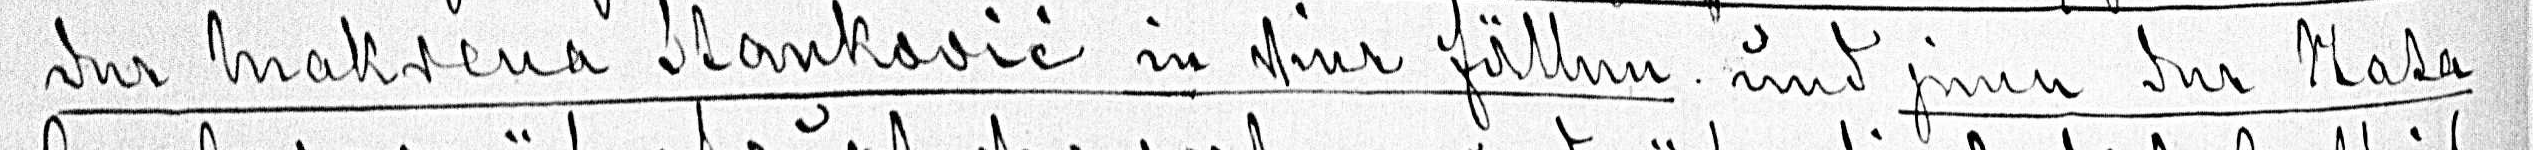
der Makrena Skanković in vier Fällen und jene der Nata
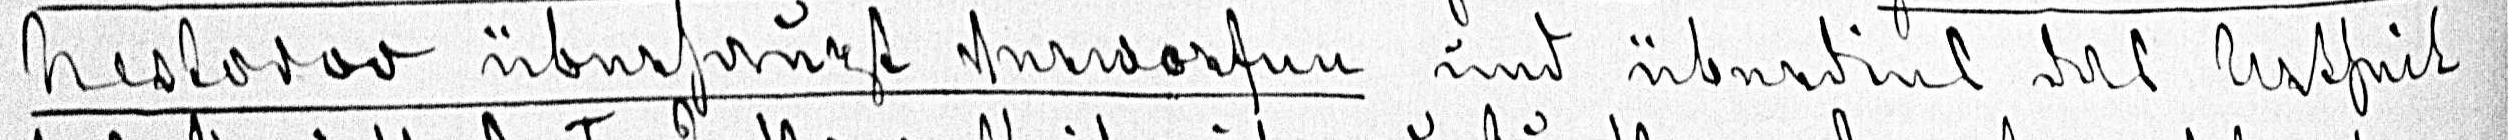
Nestorov überhaupt verworfen und überdies das Urtheil
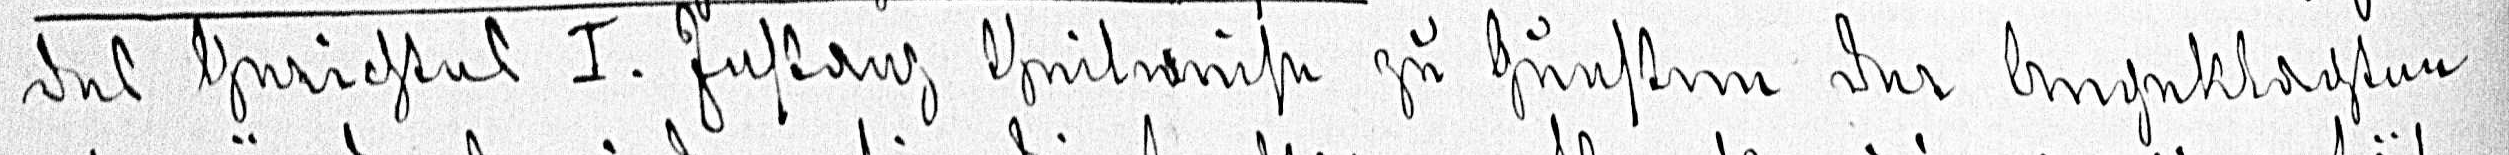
des Gerichtes I. Instanz theilweise zu Gunsten des Angeklagten
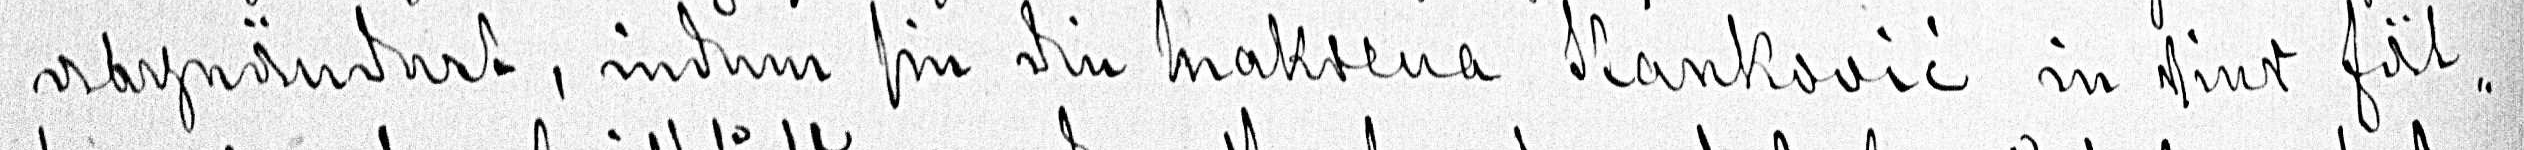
abgeändert, indem sie die Makrena Skanković in vier Fäl¬
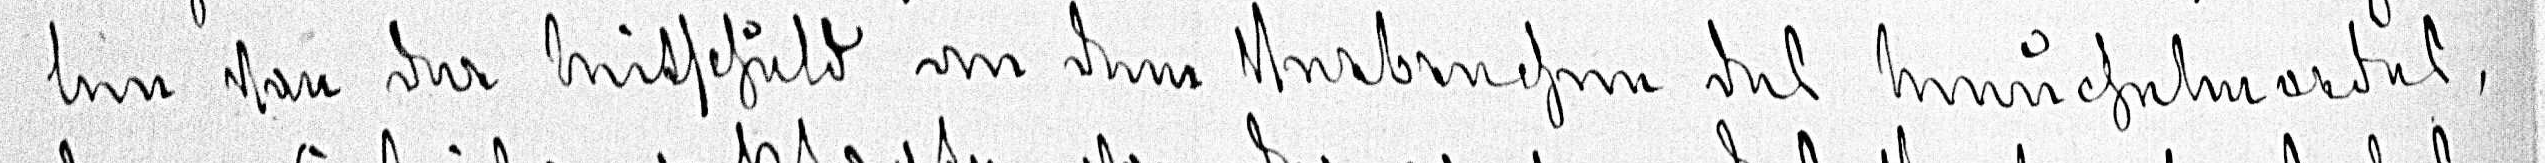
len von der Mitschuld an dem Verbrechen des Meuchelmordes,
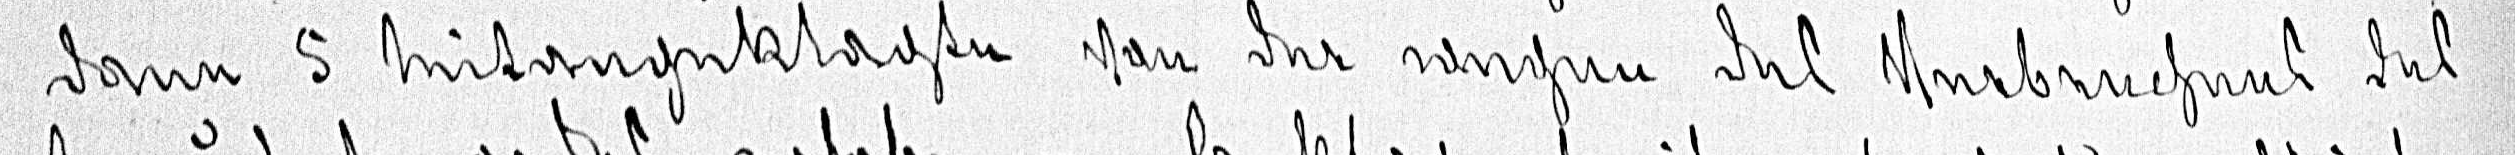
dann 5 Mitangeklagte von der wegen des Verbrechens des
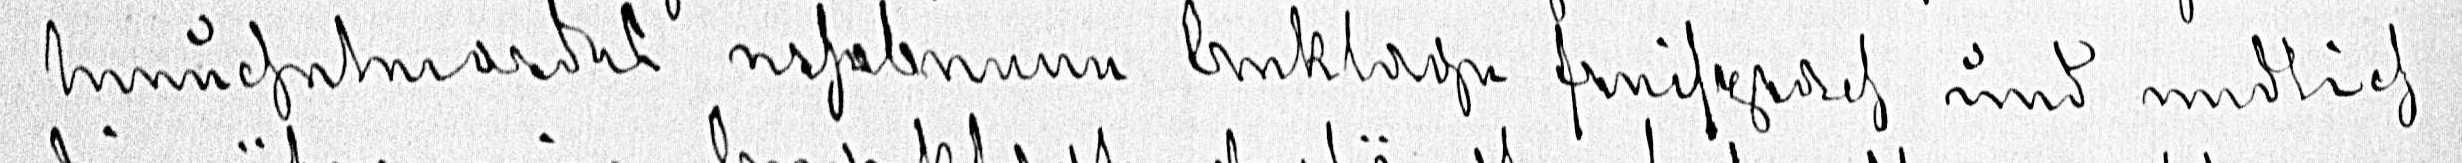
Meuchelmordes erhabenen Anklage freisprach und endlich
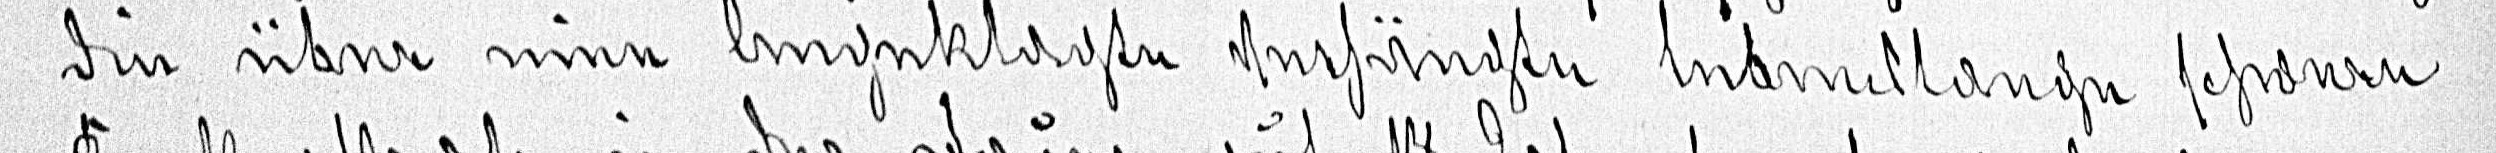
die über eine Angeklagte verhängte lebenslange schwere
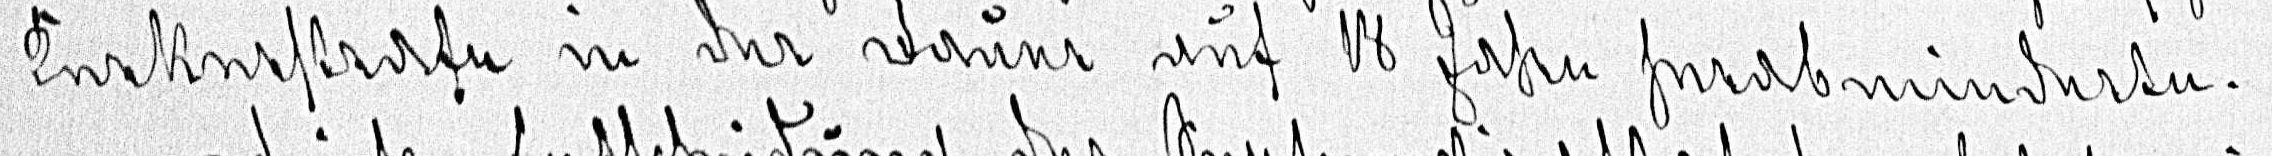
Kerkerstrafe in der Dauer auf 18 Jahre herabminderte.
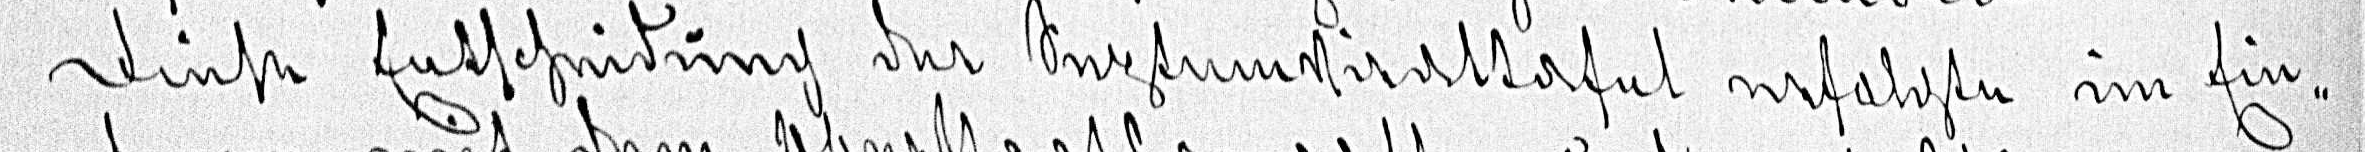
Diese Entscheidung der Septemviraltafel erfolgte im Ein¬
